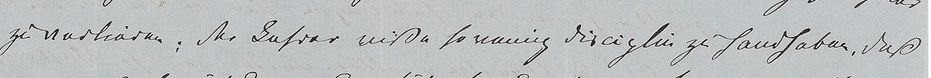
zu verlieren; der Lehrer wiße so wenig Disciplin zu handhaben, daß
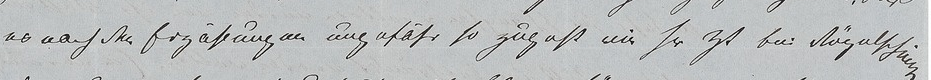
es nach den Erzählungen ungefähr so zugeht wie sr Zt bei Vögelschinz
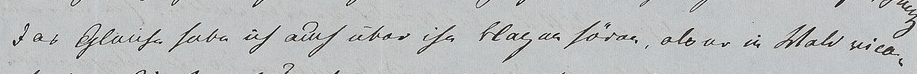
Das Gleiche habe ich auch über ihn klagen hören, als er in Wald vica-
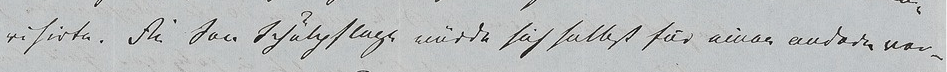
risirte. Die Sec. Schulpflege würde sich selbst für einen andern ver-
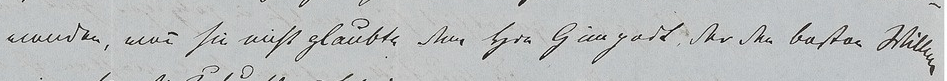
wenden, wenn sie nicht glaubte dem Hrn Gimpert, der den besten Willen
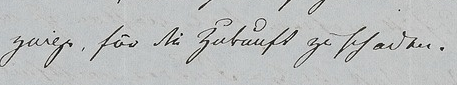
zeige, für die Zukunft zu scheiden.
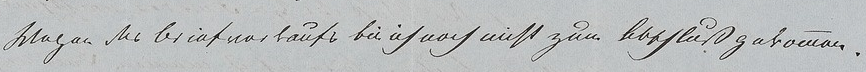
Wegen des Briefverkaufs bin ich noch nicht zum Abschluß gekommen.
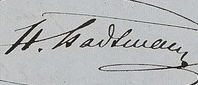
H. Stadtmann
